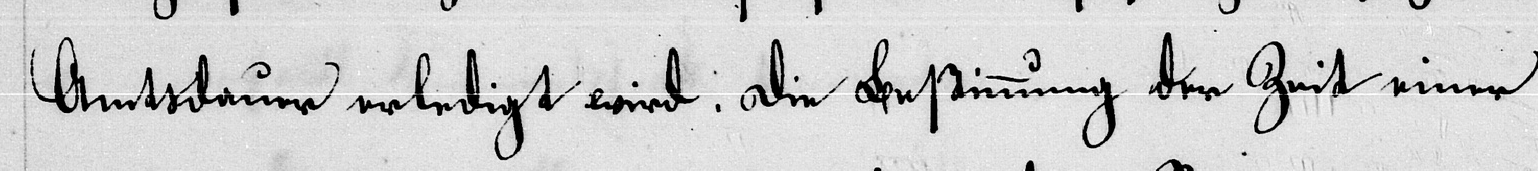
Amtsdauer erledigt wird. Die Bestimmung der Zeit einer
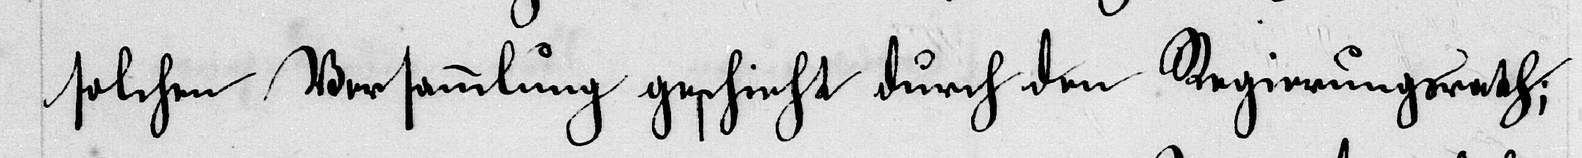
solchen Versammlung geschieht durch den Regierungsrath;
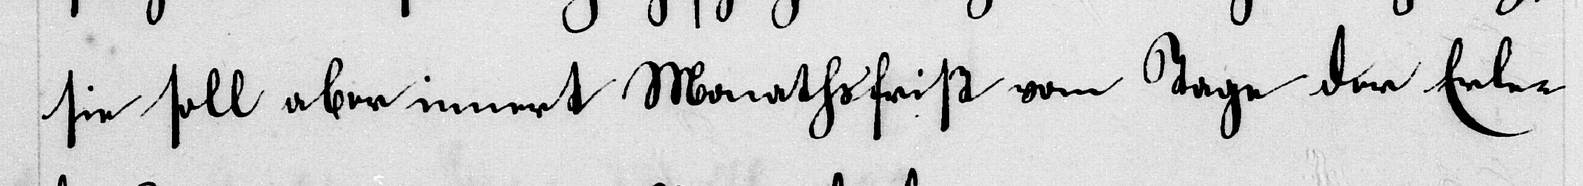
sie soll aber innert Monathsfrist vom Tage der Erle¬
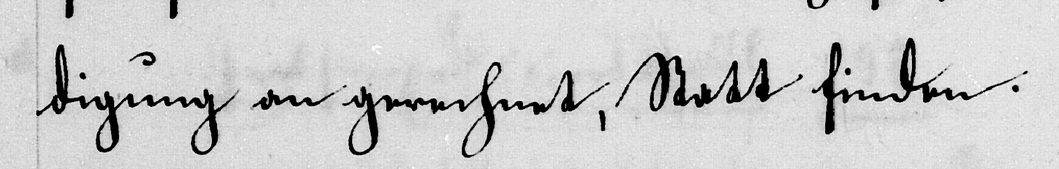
digung an gerechnet, Statt finden.
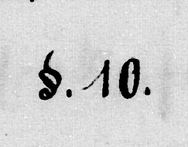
§.10.
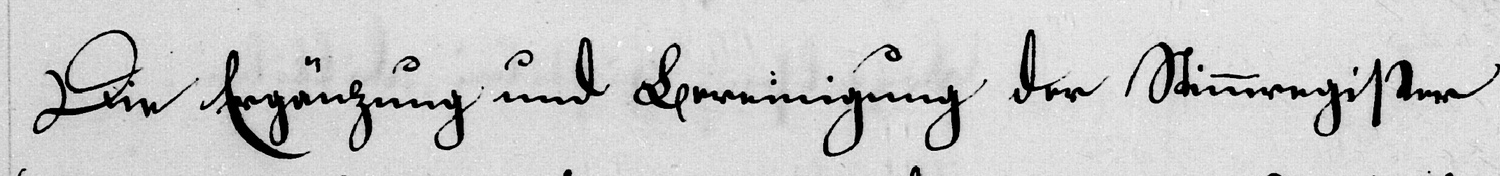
Die Ergänzung und Bereinigung der Stimmregister
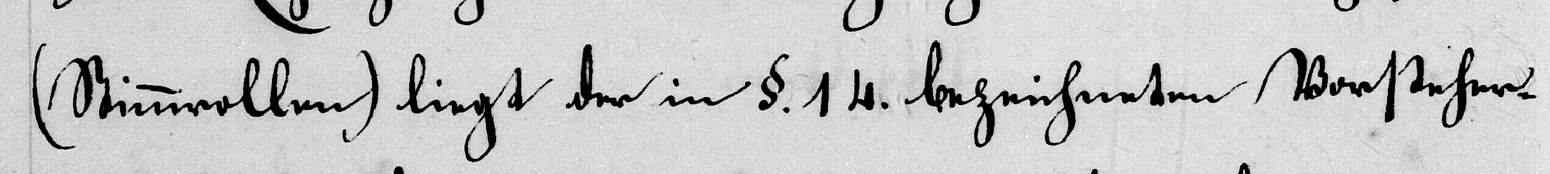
(Stimmrollen) liegt der in §.14. bezeichneten Vorsteher¬
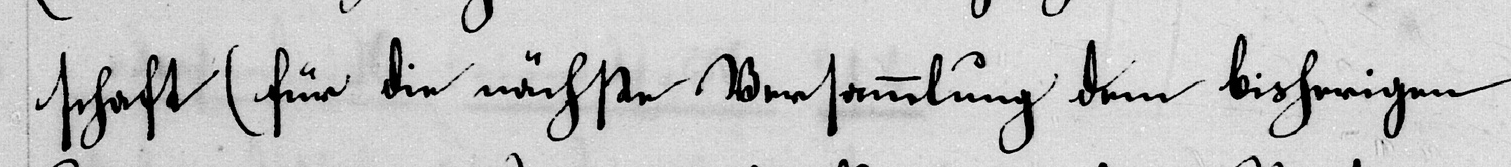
schaft (für die nächste Versammlung dem bisherigen
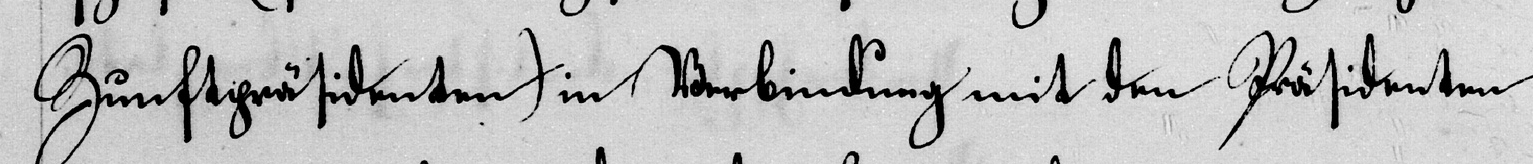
Zunftpräsidenten) in Verbindung mit den Präsidenten
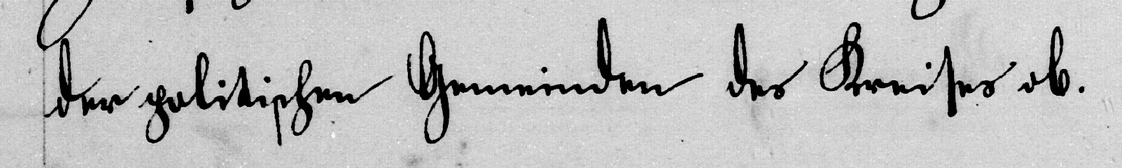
der politischen Gemeinden des Kreises ob.
